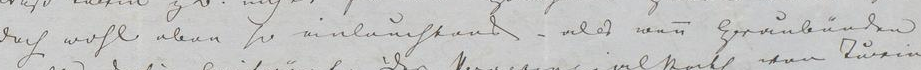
doch wohl eben so einleuchtend, als wenn Graubünden
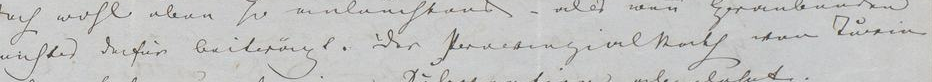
nichts dafür beiträgt. Der ProvinzialRath von Turin
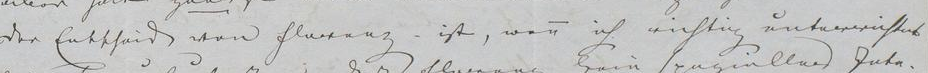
Der Entscheid von Florenz, ist, wenn ich richtig unterrichtet
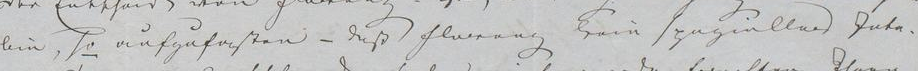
bin, so aufzufaßen, daß Florenz kein spezielles Inte-
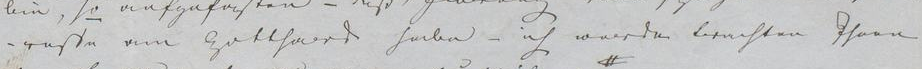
resse am Gotthard habe, ich werde trachten Ihnen
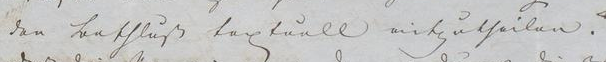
den Beschluß textuell mitzutheilen.
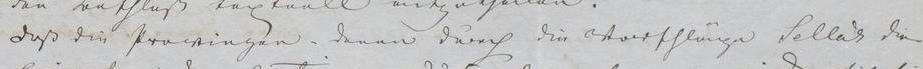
Daß die Provinzen, denen durch die Vorschläge Sella's die
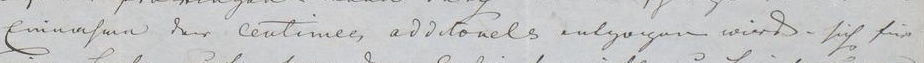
Einnahmen der Centimes additonels entzogen wird, sich für
